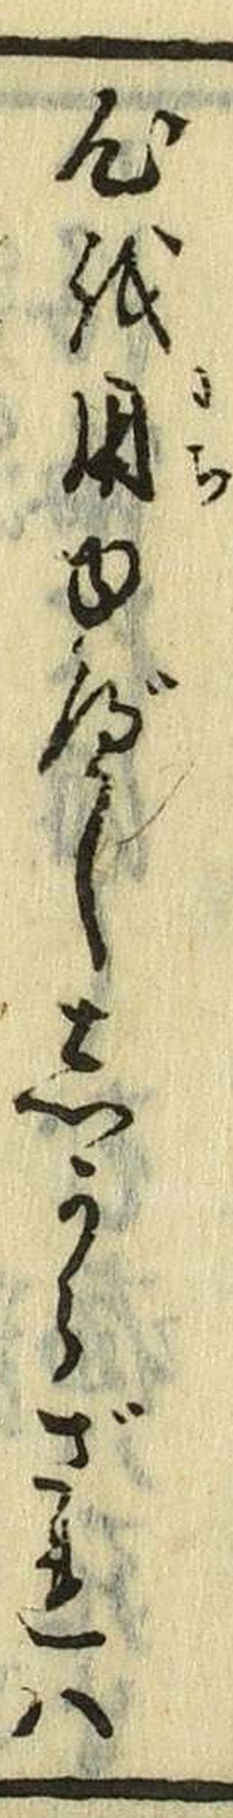心を用ゆべししからざれば
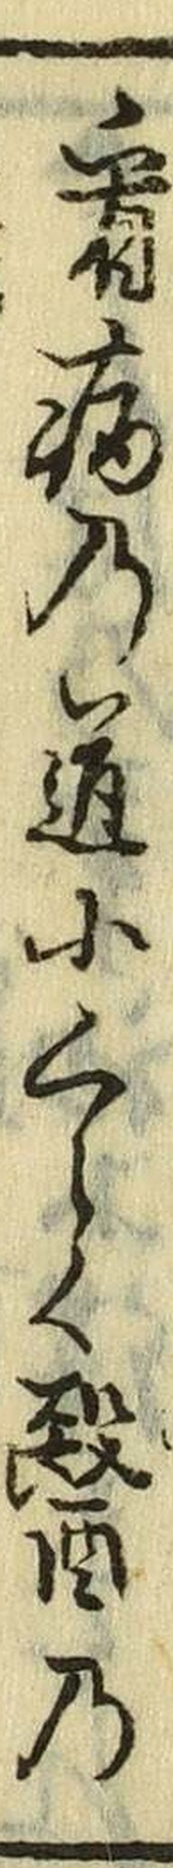看病の道にくらく医の
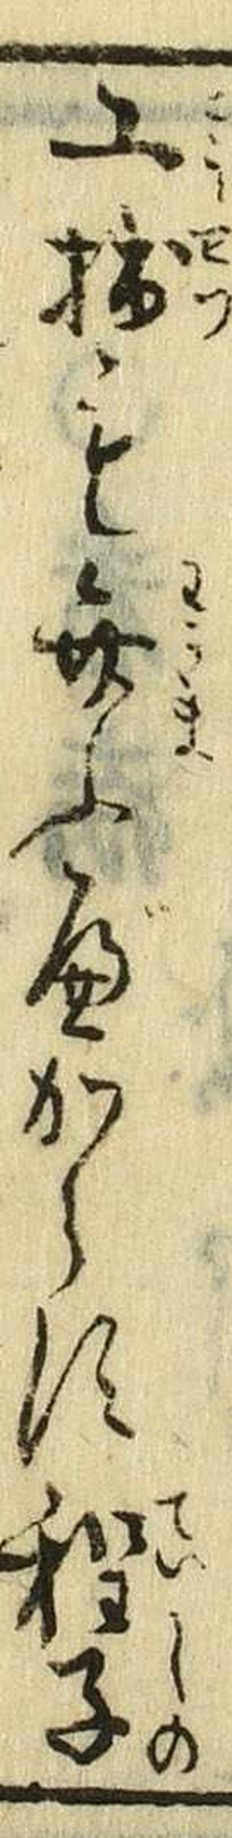工拙も弁ふへからす程子
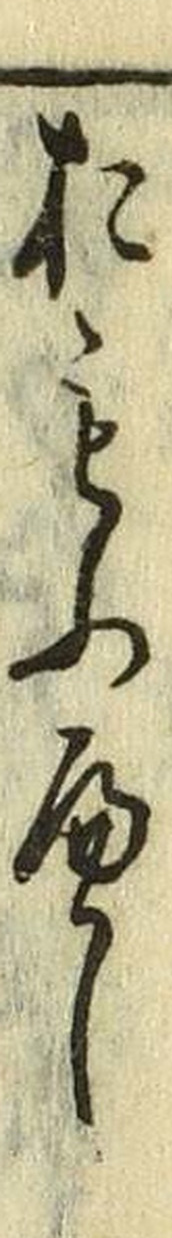おもふへし
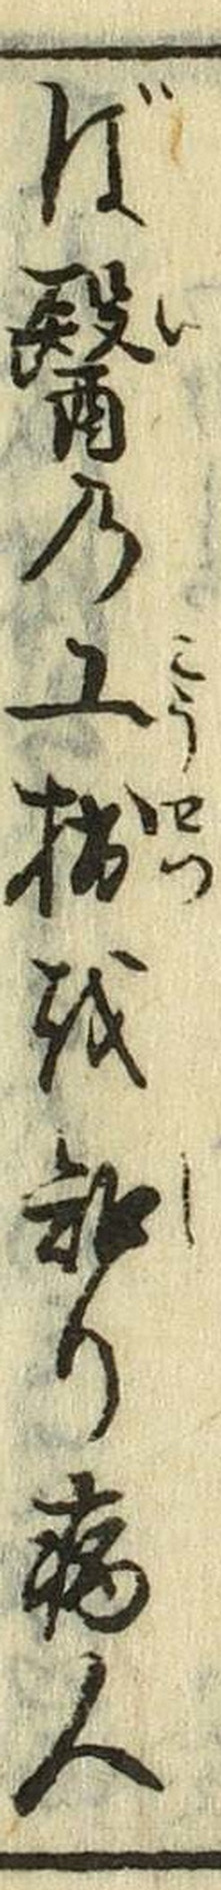ば医の工拙を知り病人
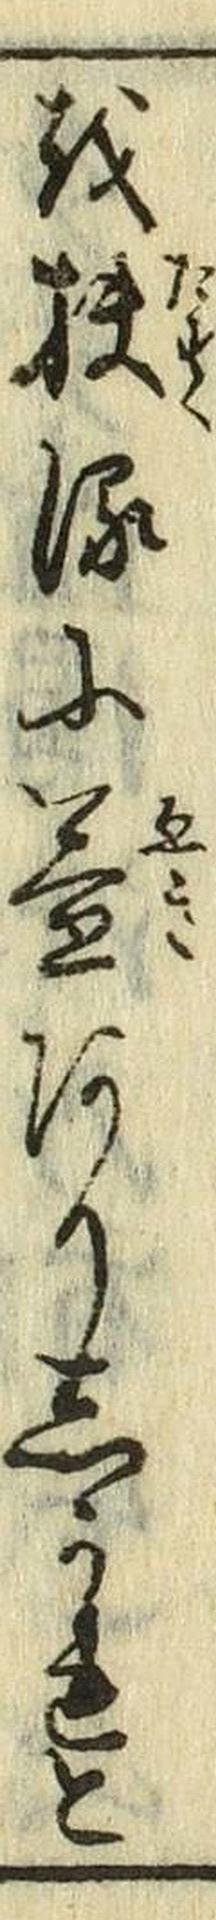を扶るに益ありしかれと
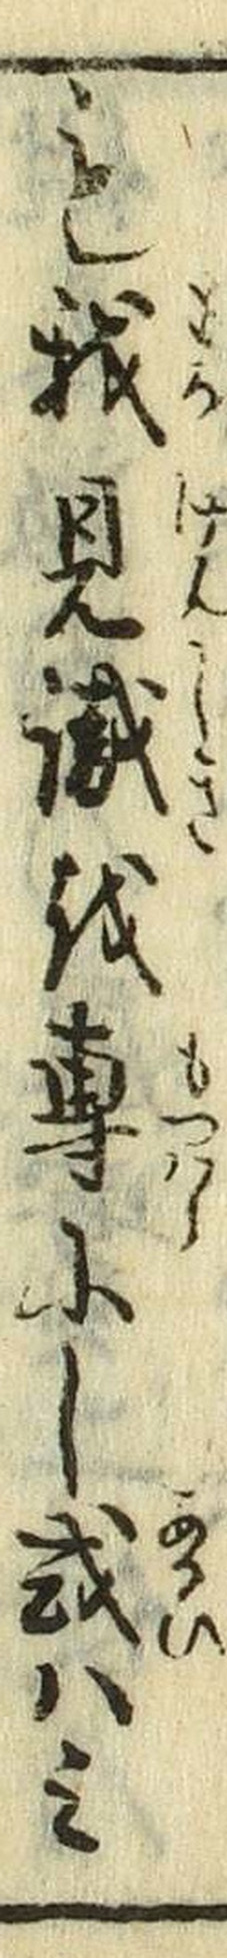も我見識を専にし或はみ
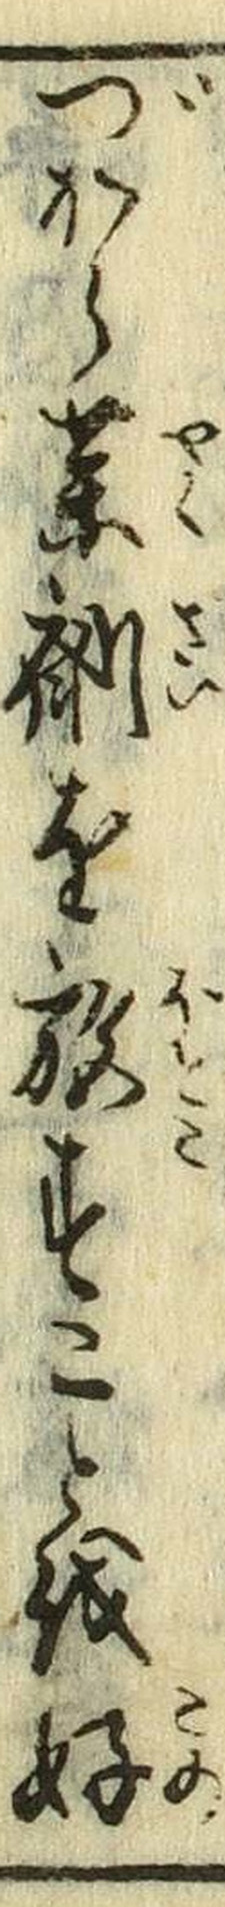づから薬剤を施すことを好
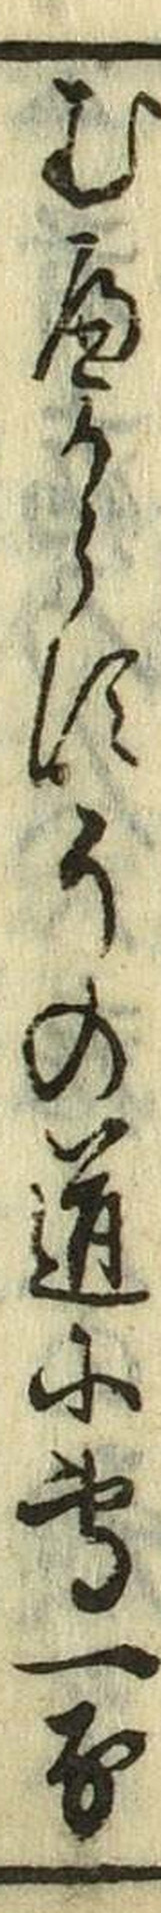むべからずその道に専一な
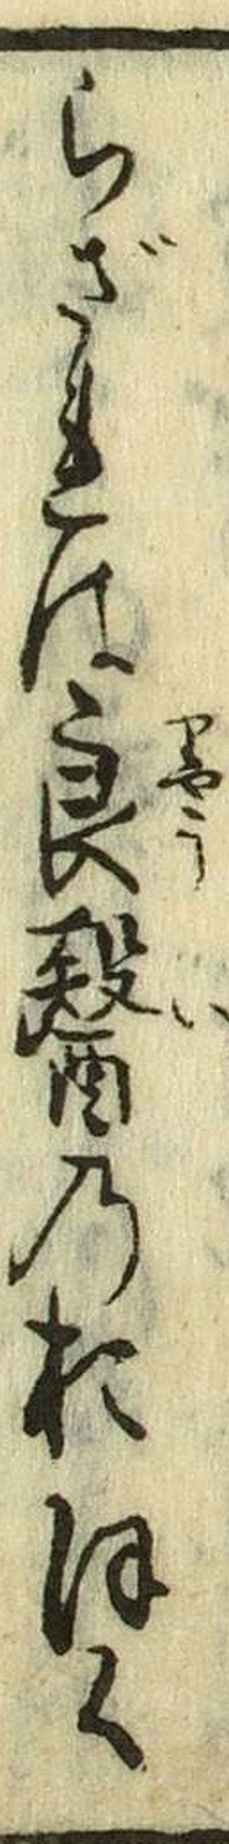らざれは良医のおほく
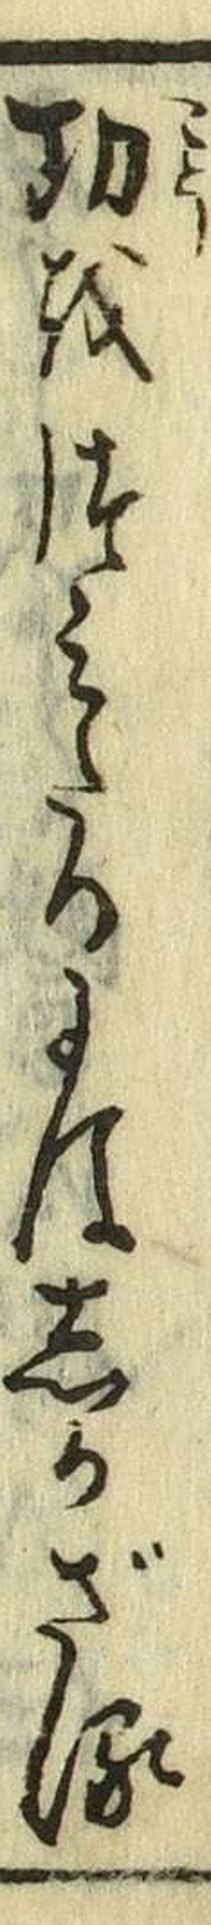功をつみたるにはしからざる

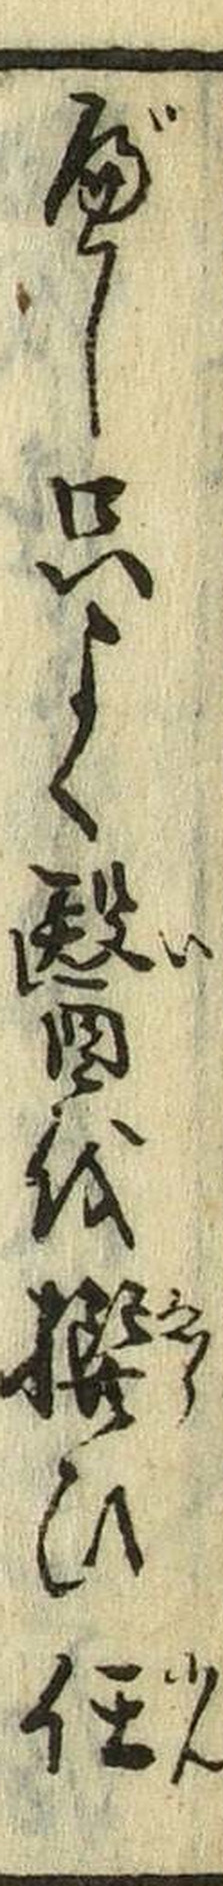べし只よく医を撰ひ任
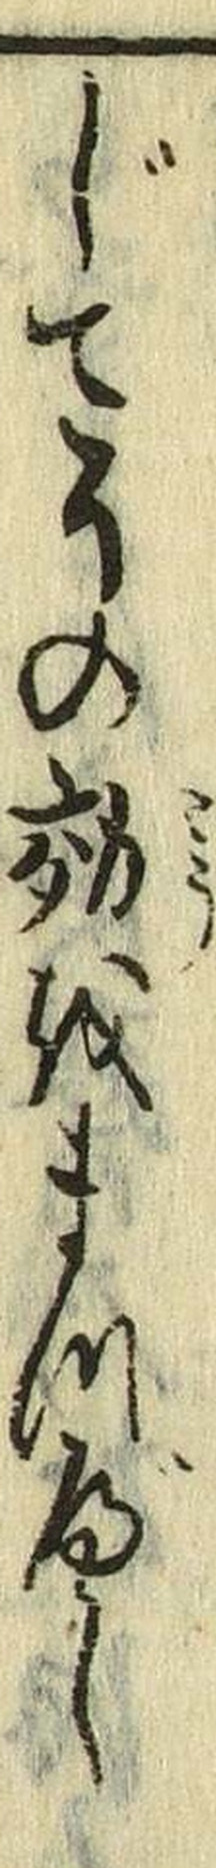じてその効をまつべし
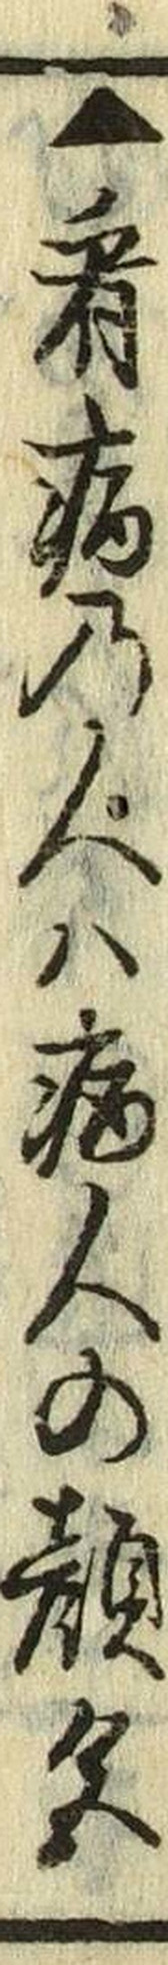▲看病の人は病人の顔色
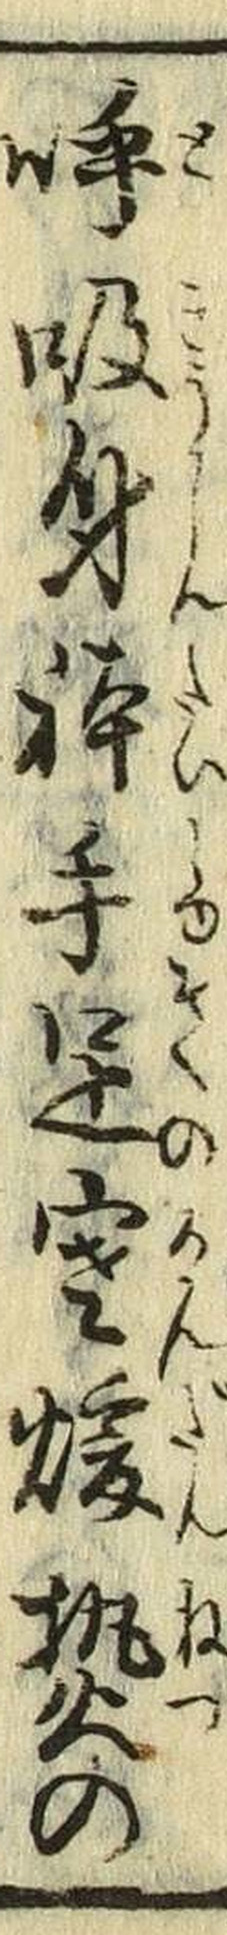呼吸身体手足寒煖熱の
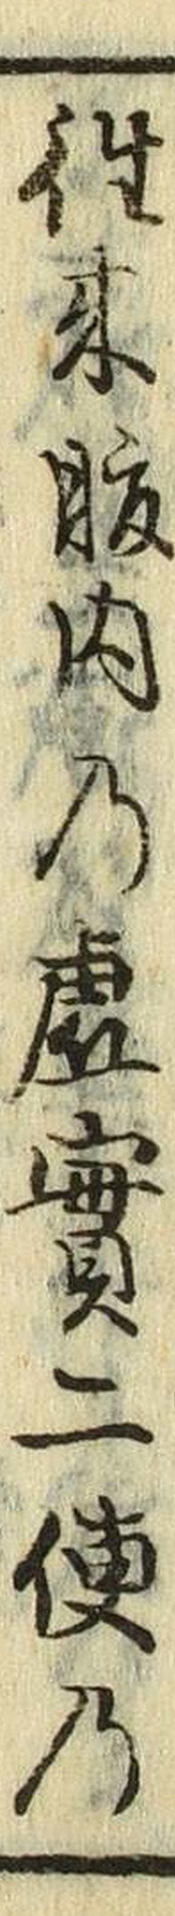往来腹内の虚実二便の
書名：居家養生記
